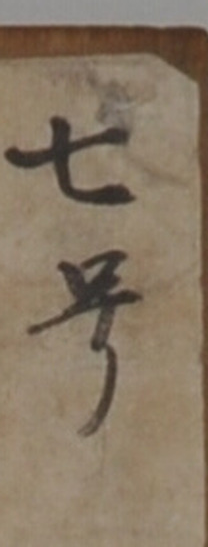七号()
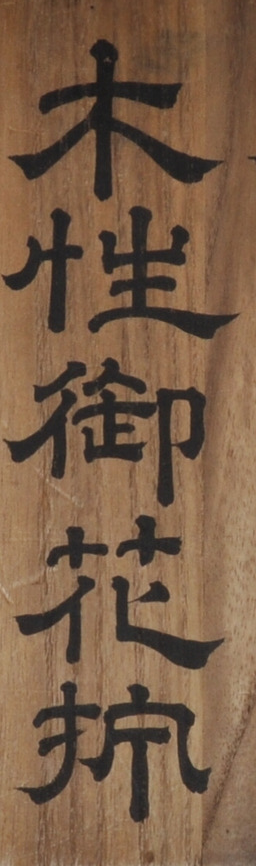木性御花押
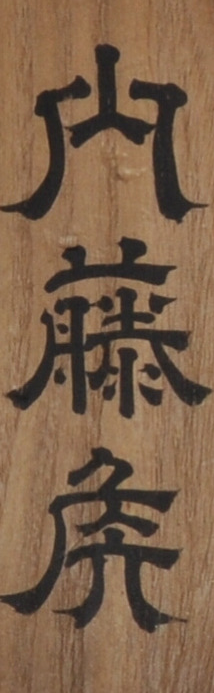内藤侯

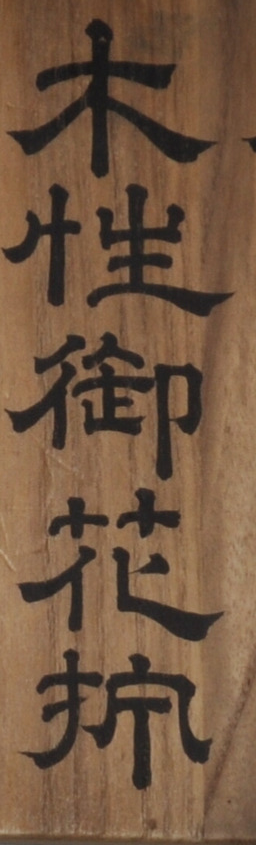木性御花押
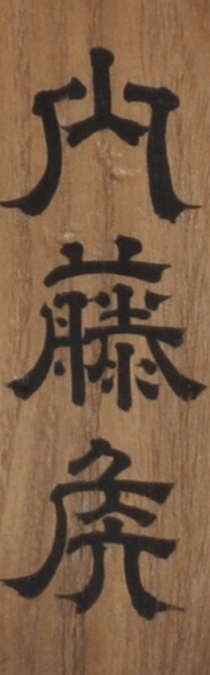内藤侯
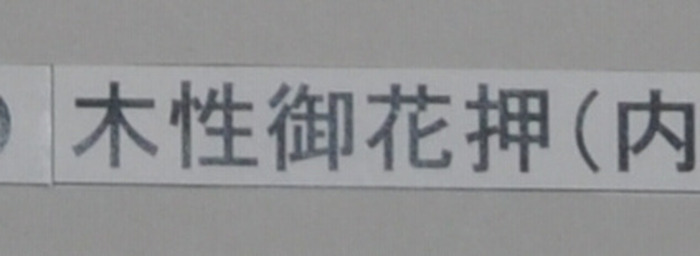木性御花押

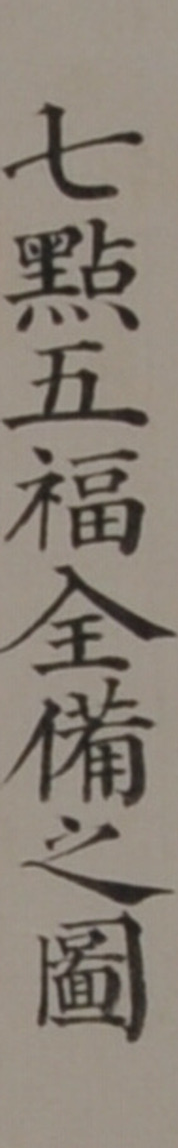七點五福全備之図
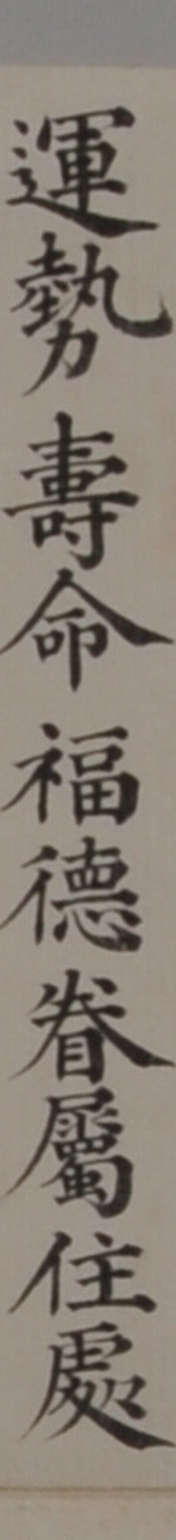運勢寿命福徳眷属住処
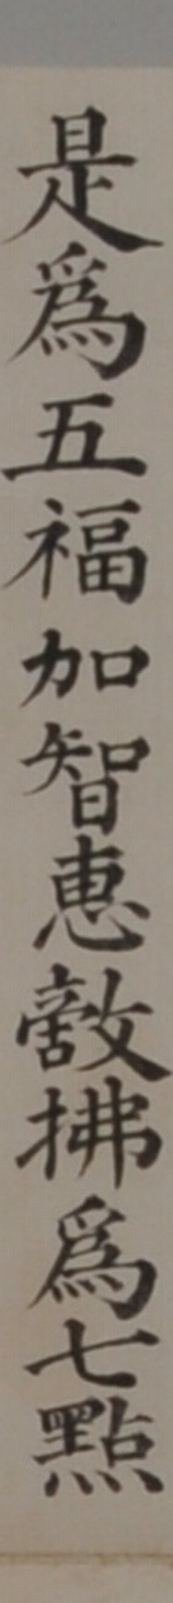是為五福加智恵敵拂為七點
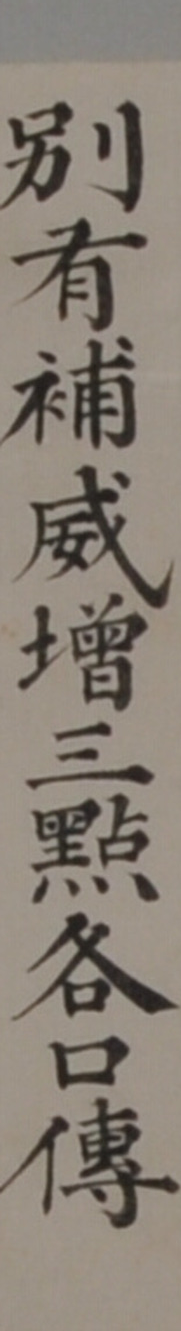別有補威増三點各口傳
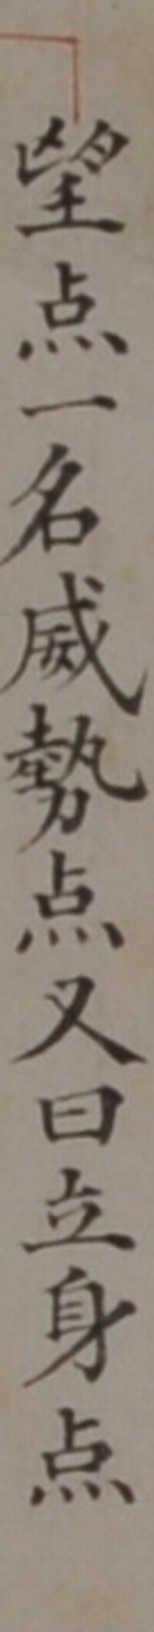望点一名威勢点又曰立身点
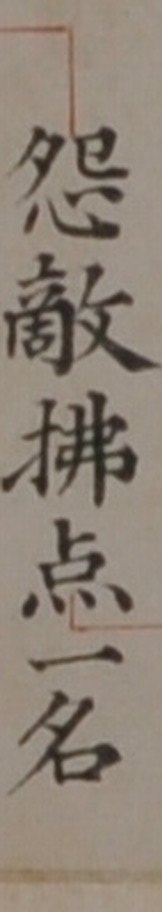怨敵拂点一名
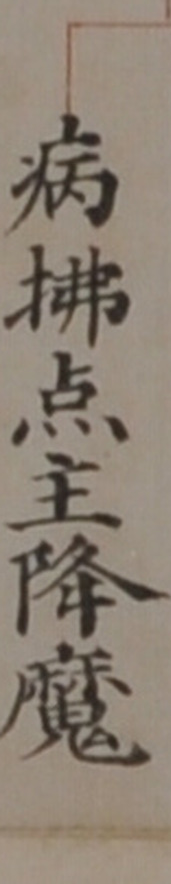病拂点主降魔
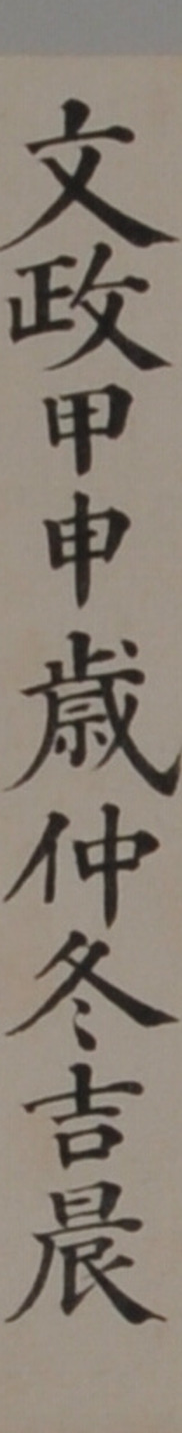文政甲申歳仲冬吉晨
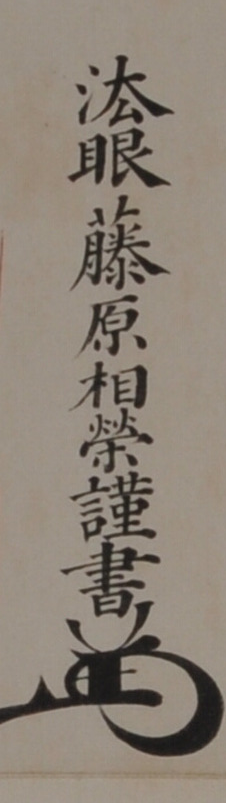法眼藤原相栄謹書
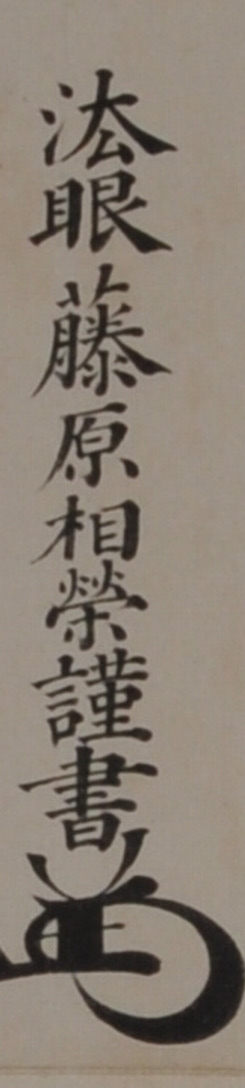法眼藤原相栄謹書
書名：木性御花押
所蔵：伊那市立高遠町図書館・合同会社AMANE
